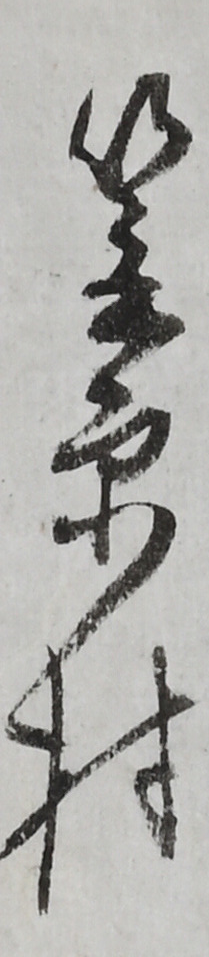笠原村
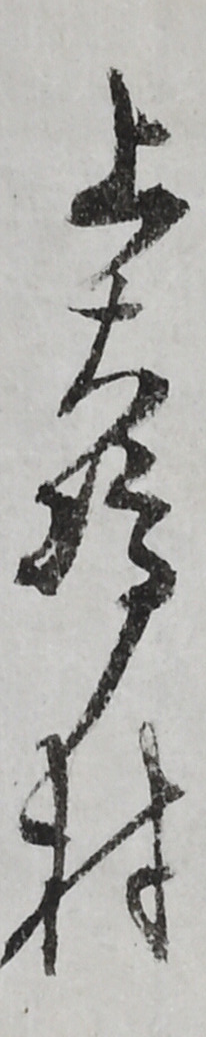上大嶋村
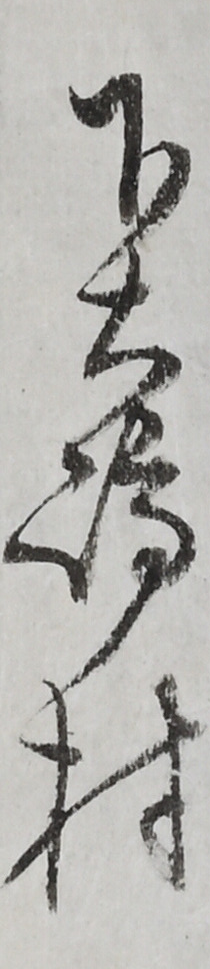下大嶋村
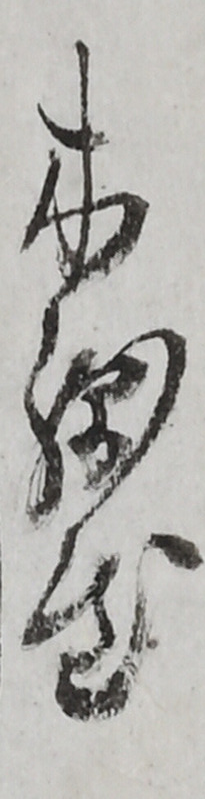木綿屋
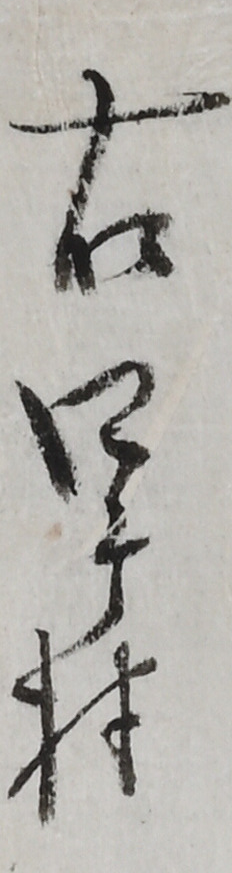右四ヶ村
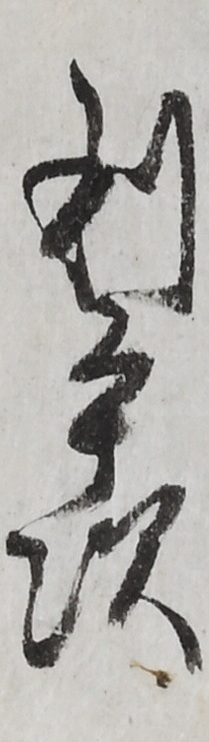利平次
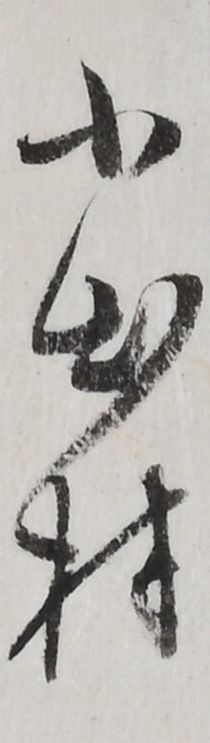小出村
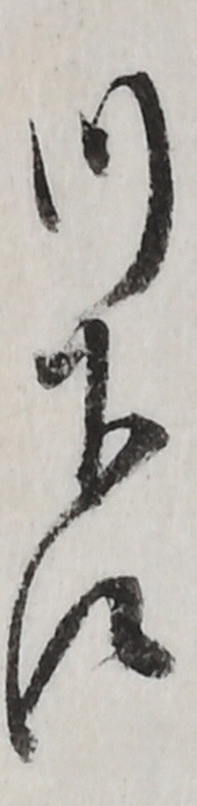川下郷
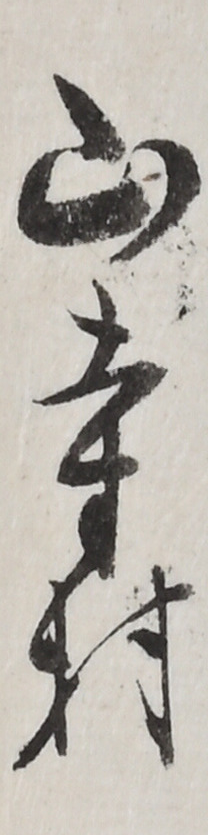山寺村
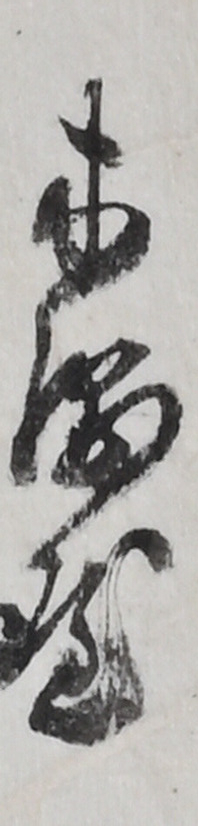木綿屋
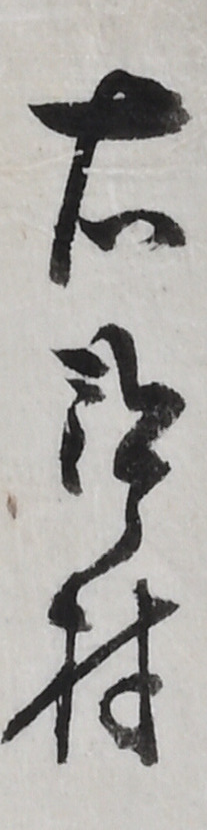右弐ヶ村
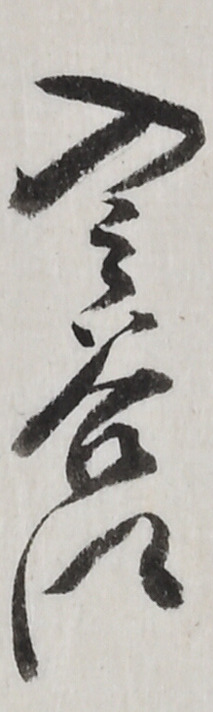入之谷郷
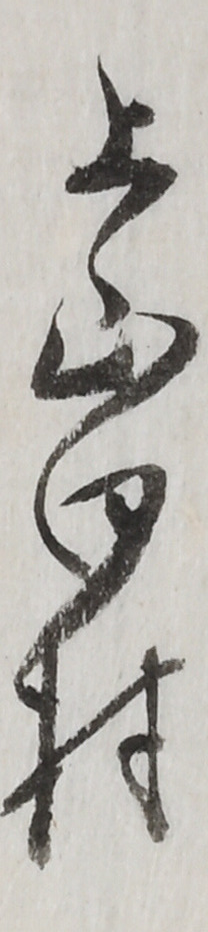上山田村
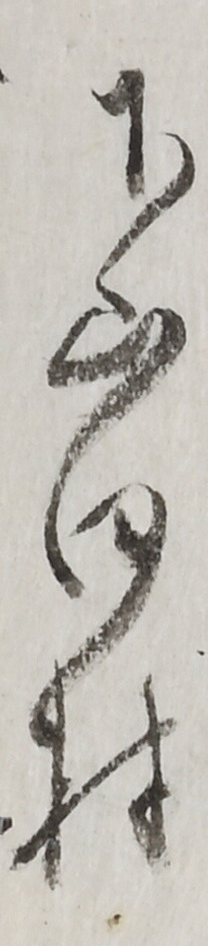下山田村
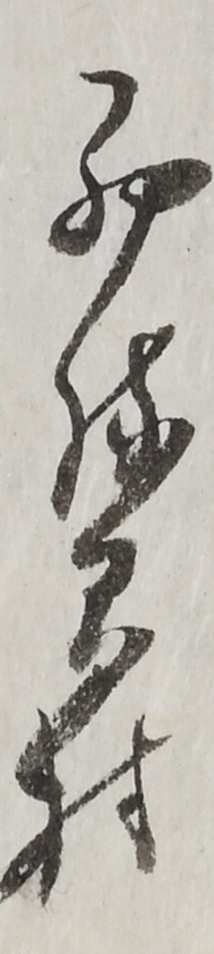西勝間村
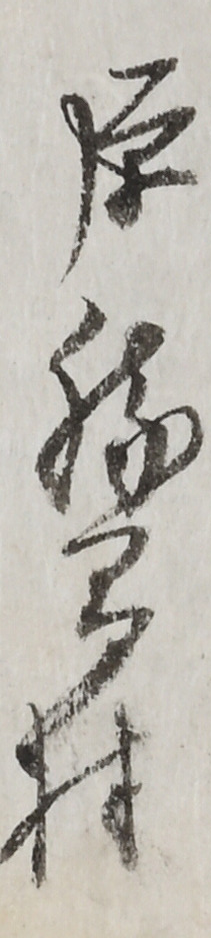西勝間村
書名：年内行事帳
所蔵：伊那市立高遠町図書館・合同会社AMANE
